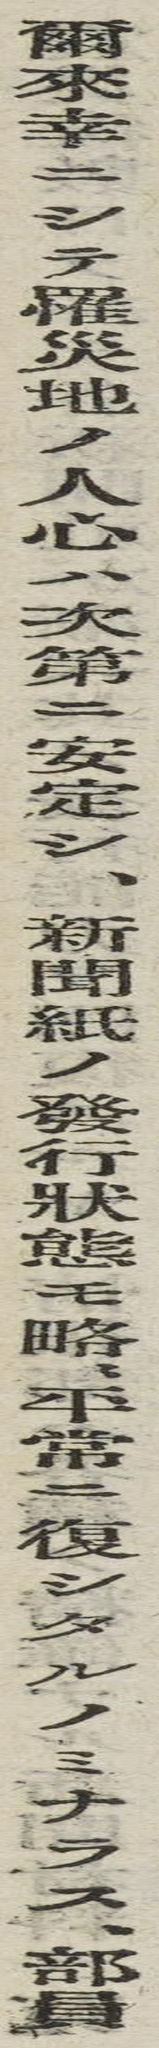爾来幸ニシテ罹災地ノ人心ハ次第ニ安定シ、新聞紙ノ発行状態モ略〻平常ニ復シタルノミナラス、部員
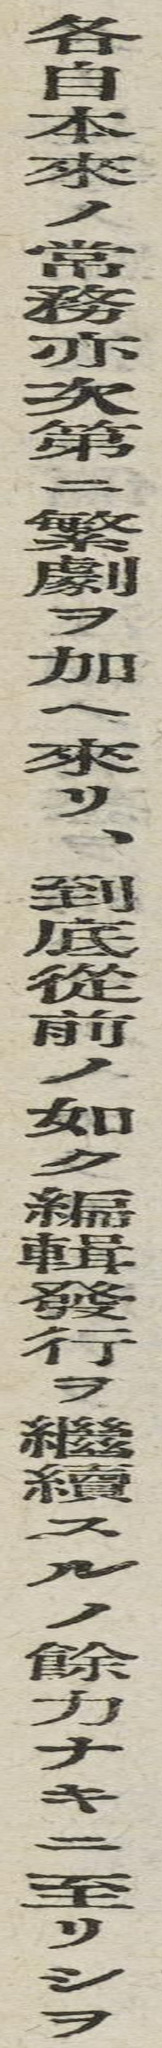各自本来ノ常務亦次第ニ繁劇ヲ加ヘ来リ、到底従前ノ如ク遍輯発行ヲ継続スルノ余力ナキニ至リシヲ
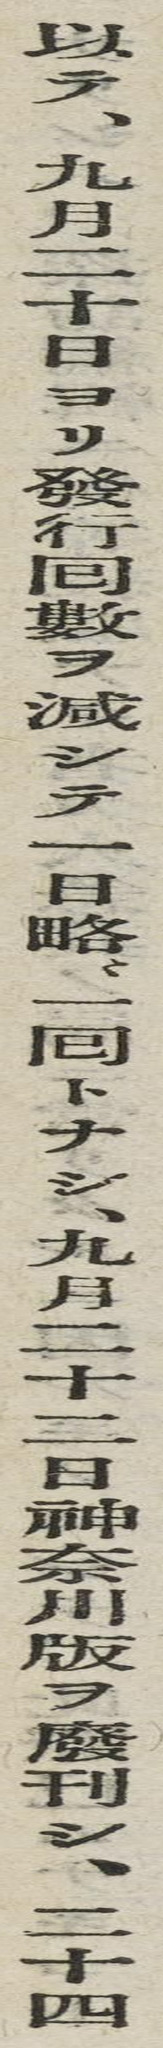以テ、九月二十日ヨリ発行回数ヲ減シテ一日略〻一回トシ、九月二十二日神奈川県版ヲ廃刊シ、二十四
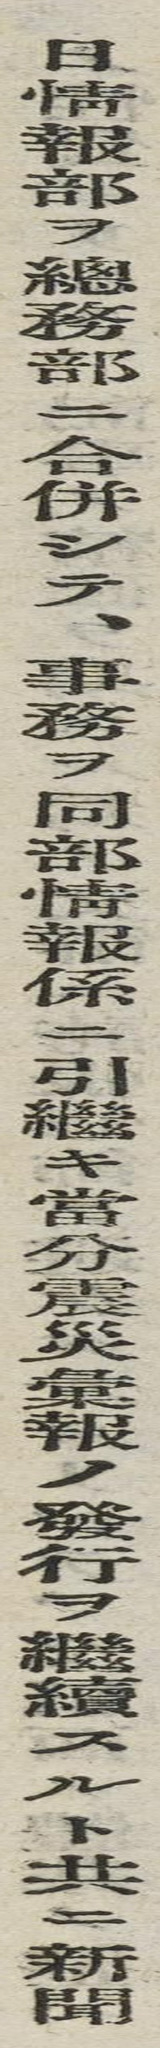日情報部ヲ総務部ニ合併シテ、事務ヲ同部情報係ニ引継キ当分震災実報ノ発行ヲ継続スルト共ニ新聞
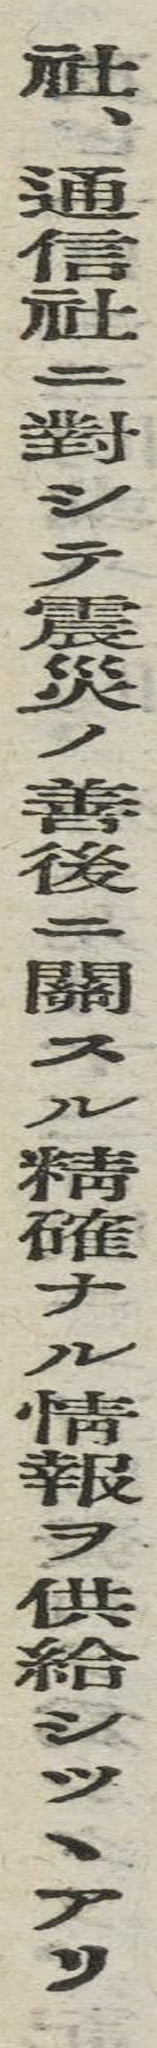社、通信社ニ対シテ震災ノ善後ニ関スル精確ナル情報ヲ供給シツヽアリ
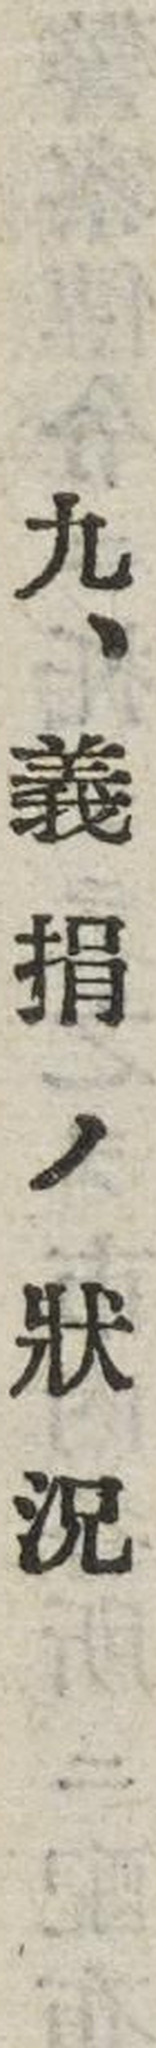九、義捐ノ状況
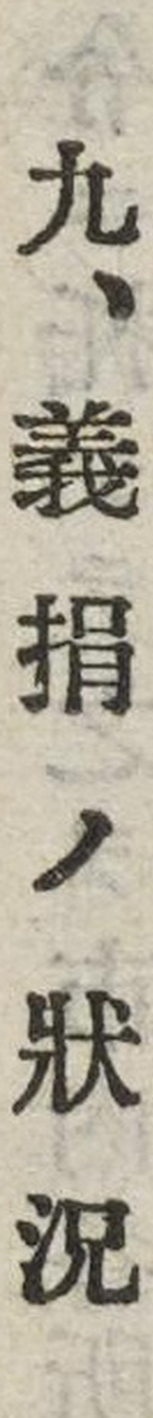九、義捐ノ状況
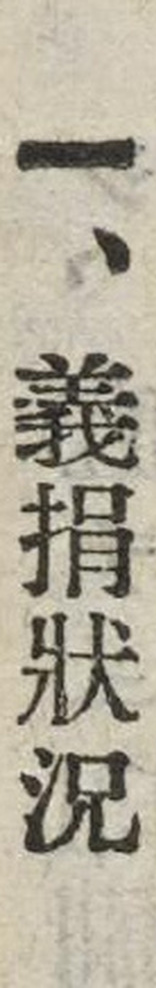一、義捐状況
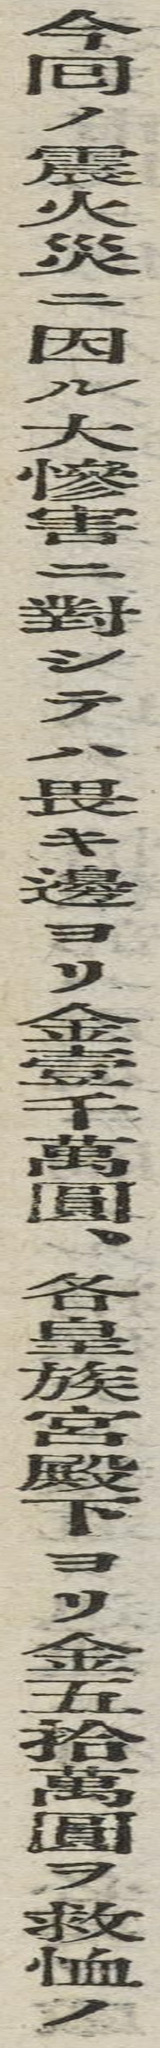今回ノ震火災ニ因ル大惨害ニ対シテハ畏キ辺ヨリ金一千万円、各皇族宮殿下ヨリ金五拾万円ヲ救恤ノ
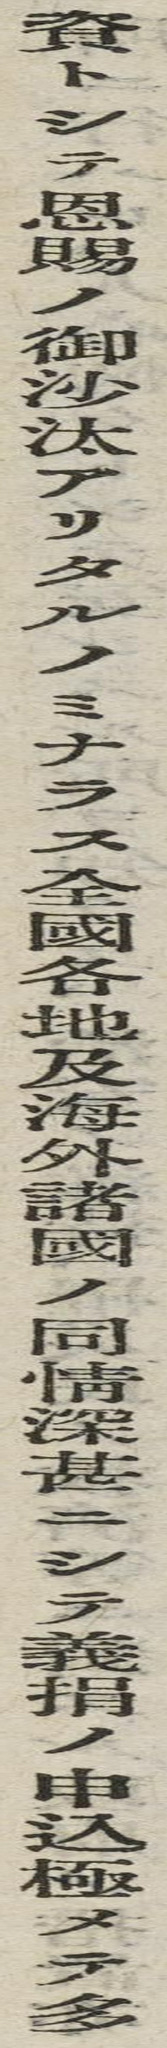資トシテ恩賜ノ御沙汰アリタルノミナラス全国各地及海外諸国ノ同情深甚ニシテ義捐ノ申込極メテ多
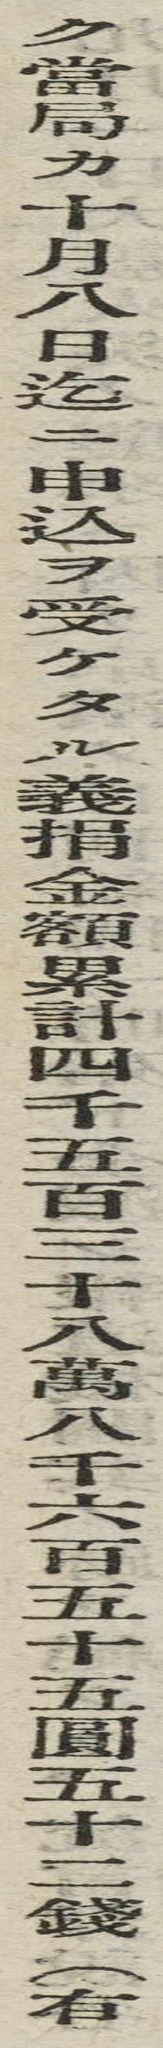ク当局カ十月八日迄ニ申込ヲ受ケタル義捐金額累計四千五百三十八万八千六百五十五円五十二銭（有
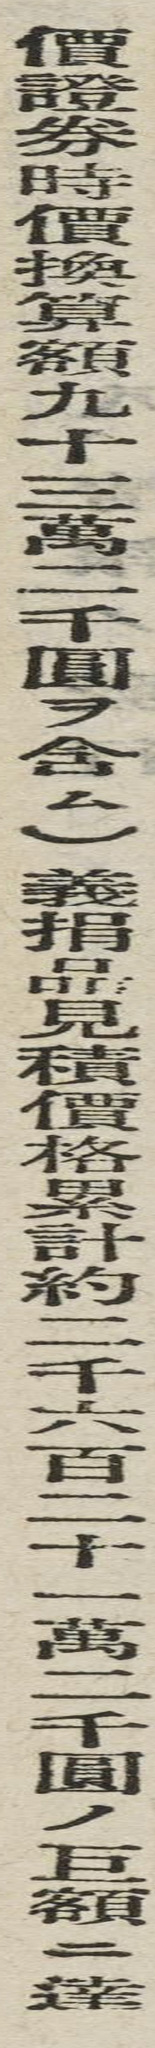価証券時価換算額九十三万二千円ヲ含ム）義捐品見積価格累計約二千六百二十一万二千円ノ巨額ニ達
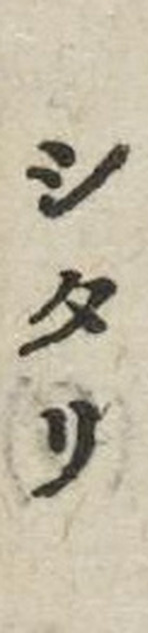シタリ
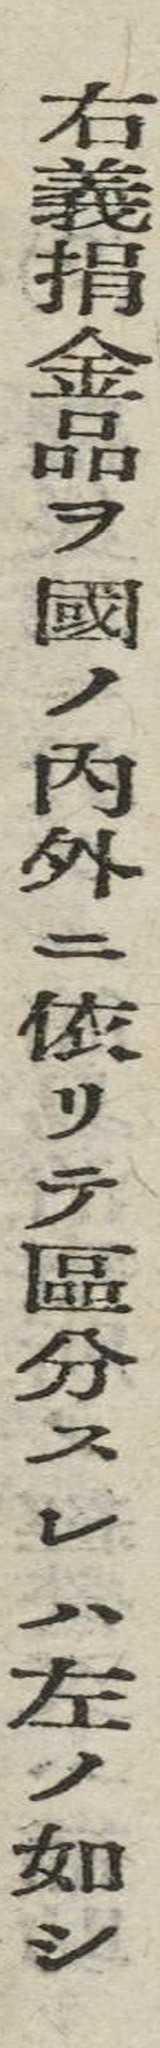右義捐金品ヲ国ノ内外ニ依リテ区分スレハ左ノ如シ
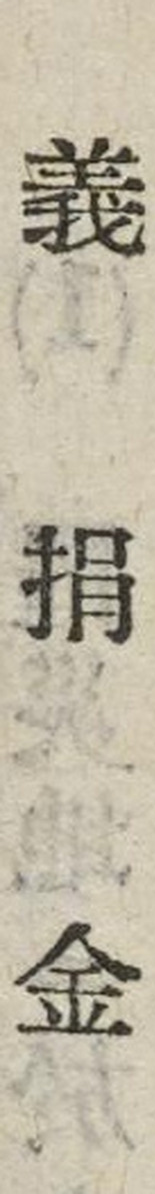義捐金
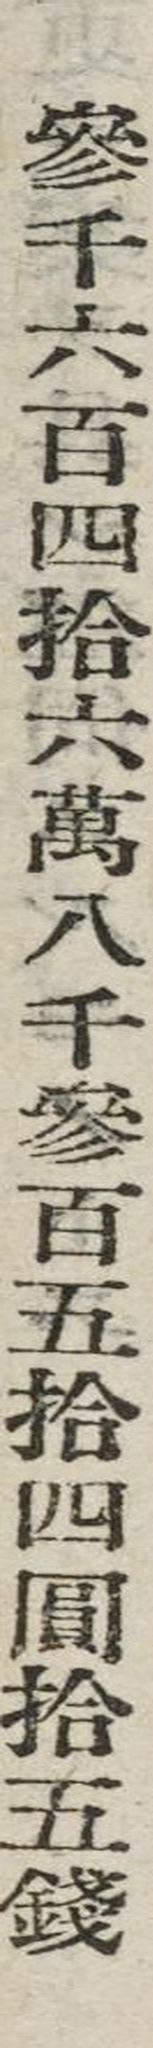内地参千六百四拾六万八千参百五拾四円拾五銭
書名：震災被害状況並救護施設概要
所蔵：東京大学地震研究所図書室 Earthquake Research Institute Library, The University of Tokyo, JAPAN
